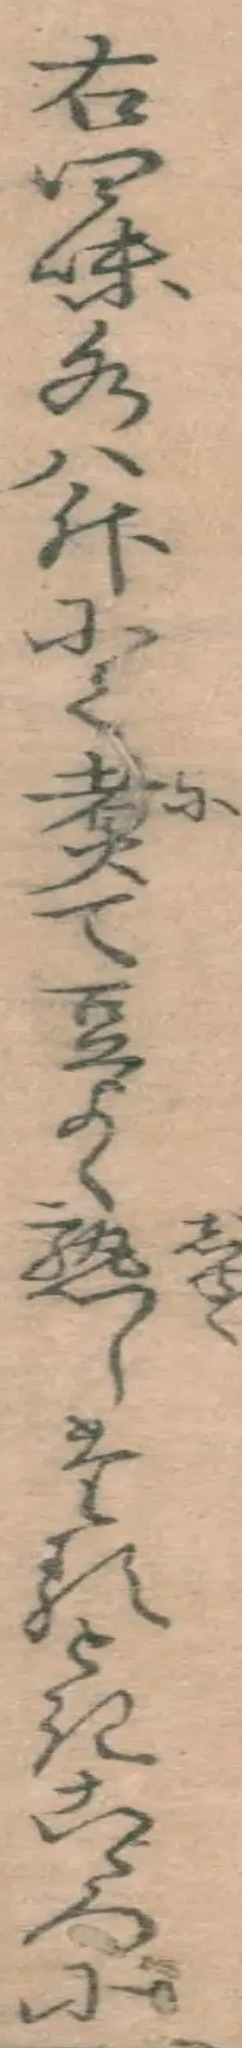右四味水八升にて煮て豆よく熟したるときこゝろに

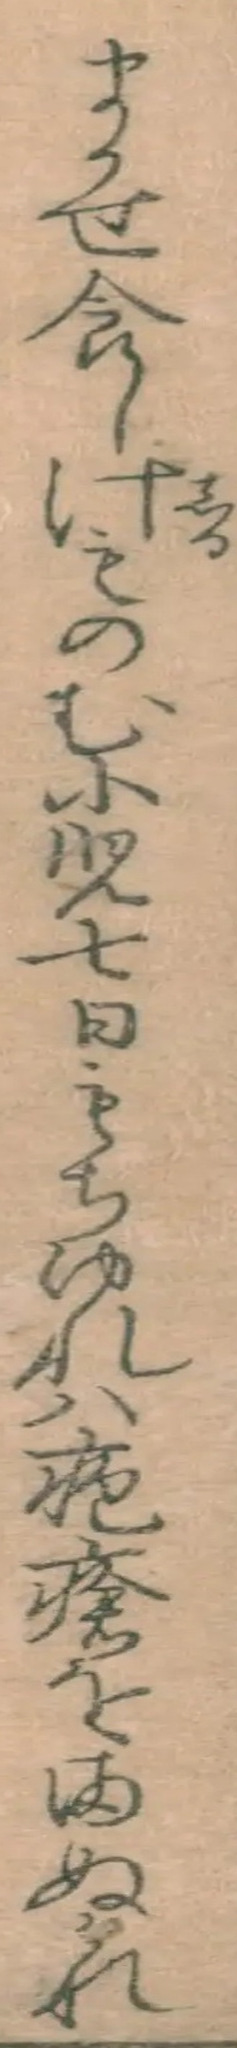まかせ食し汁ものむ小児七日もちゆれは疱瘡をまぬかれ
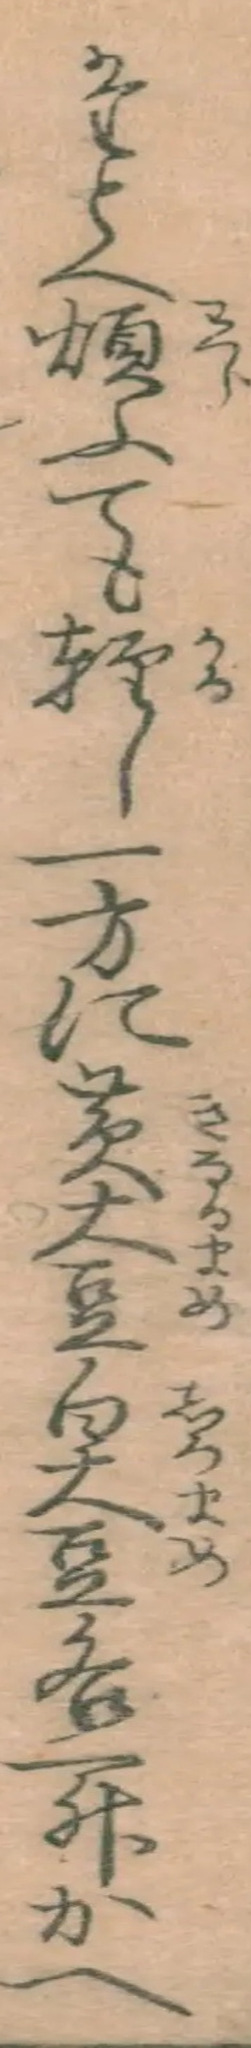たとへ煩ふても軽し一方に黄大豆白大豆各一升かへ
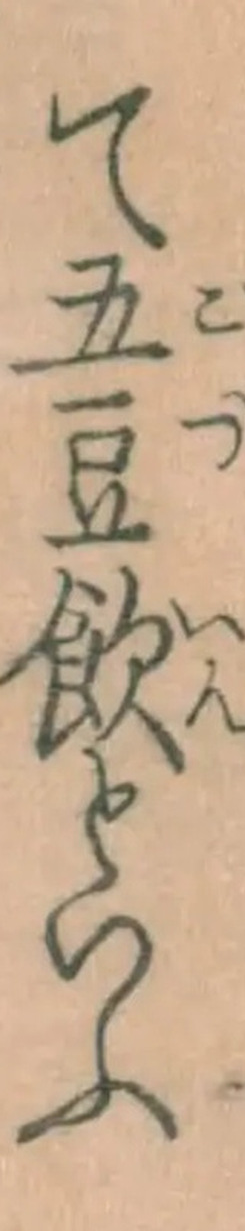て五豆飲といふ
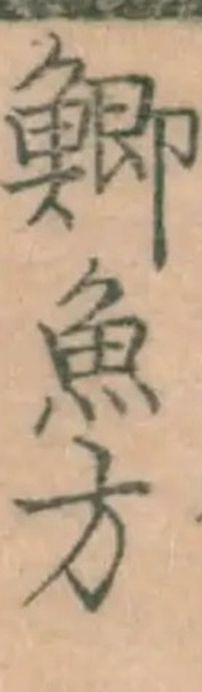鯽魚方
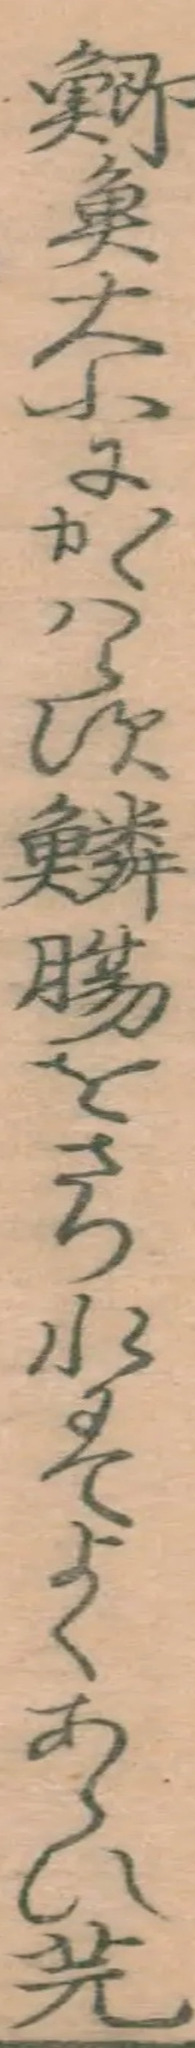鯽魚大小にかゝはらす鱗膓をさり水にてよくあらひ芫
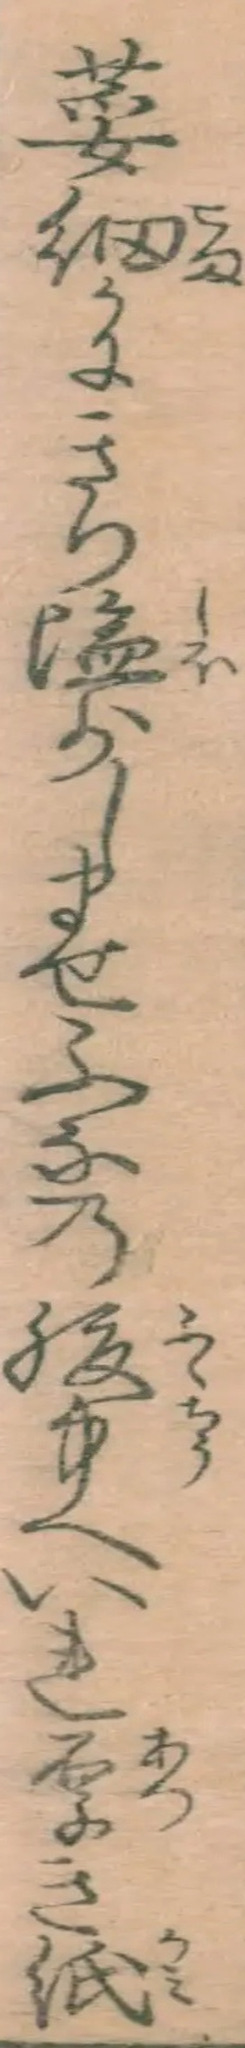荽細かにきり塩少しませふなの腹中へいれ厚き紙
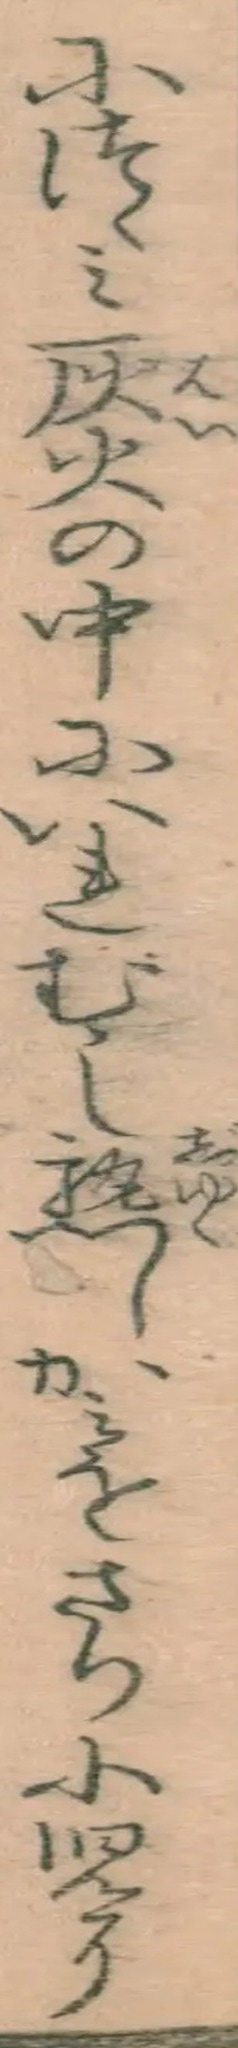につゝみ灰火の中にいれむし熟しかみをさり小児に
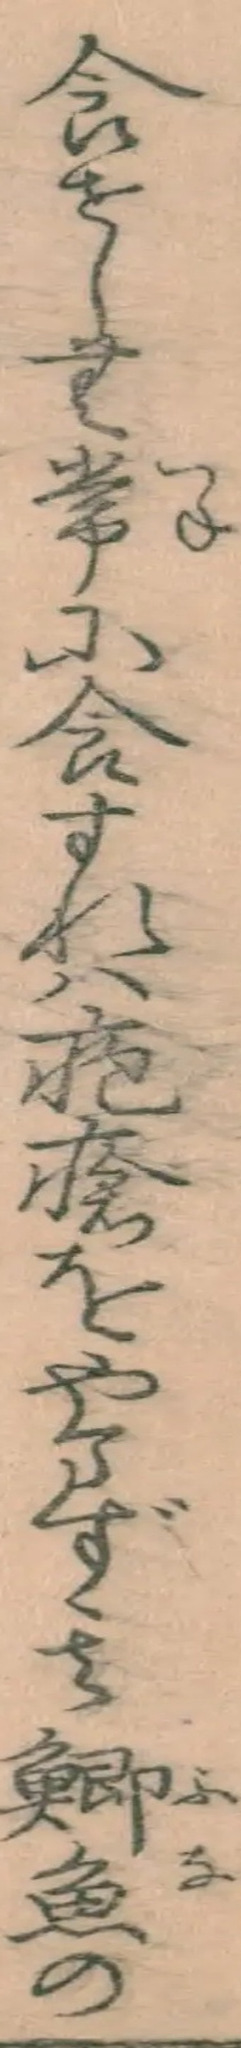食せしむ常に食すれは疱瘡をやまず其鯽魚の
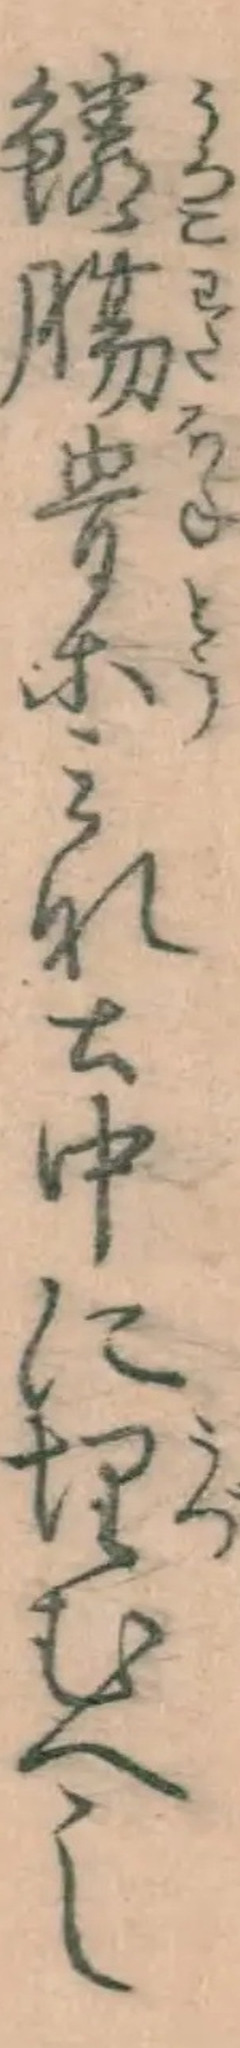鱗膓骨等みな土中に埋むへし
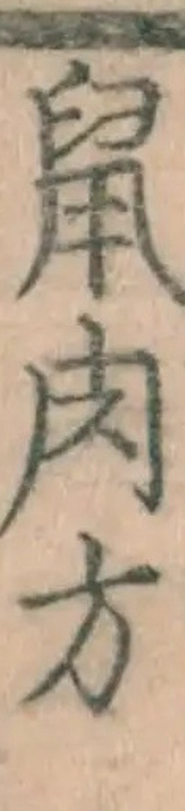鼠肉方
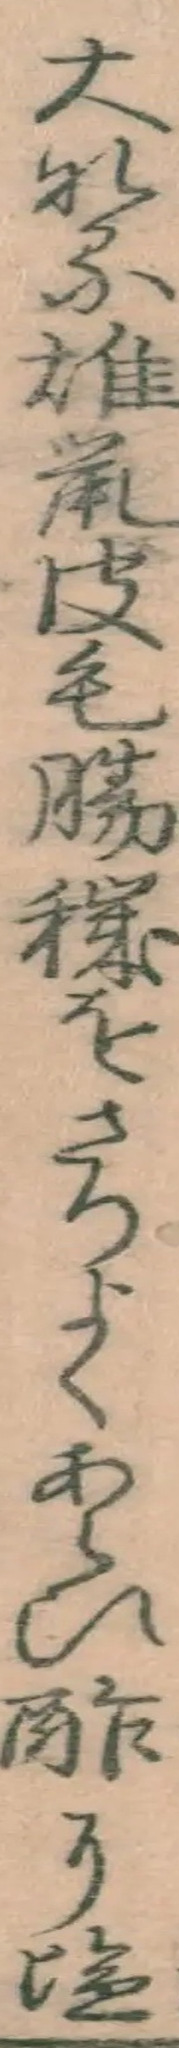大なる雄鼠皮毛膓穢をさりよくあらひ酢に塩
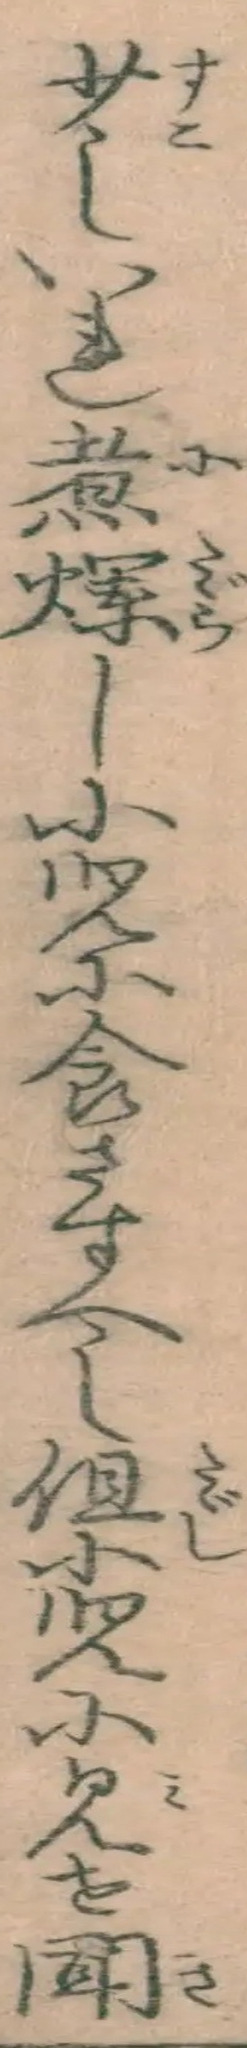少しいれ煮爛し小児に食さすへし但小児に見せ聞

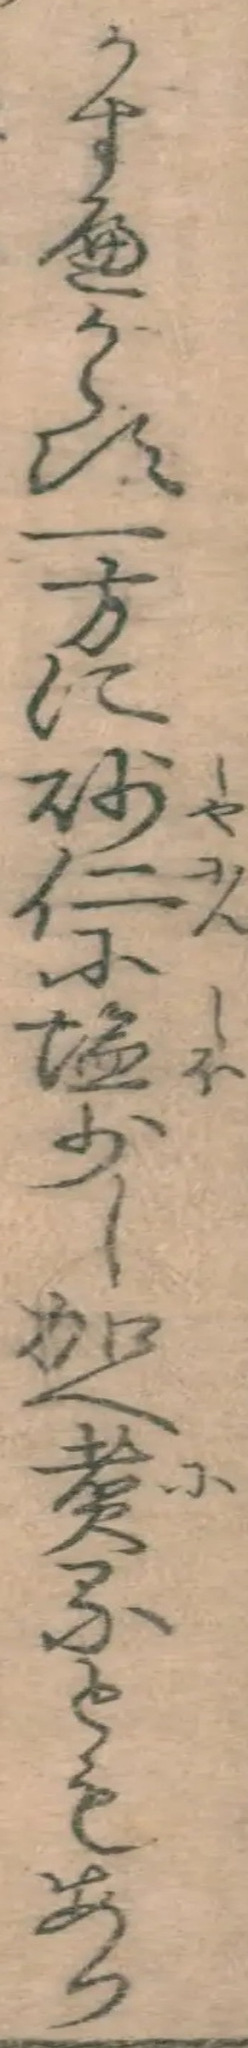かすへからす一方に砂仁に塩少し加へ煮るともあり
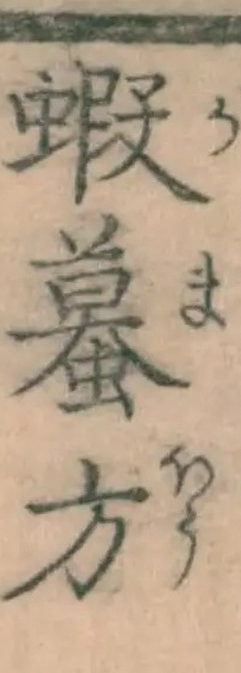蝦蟇方
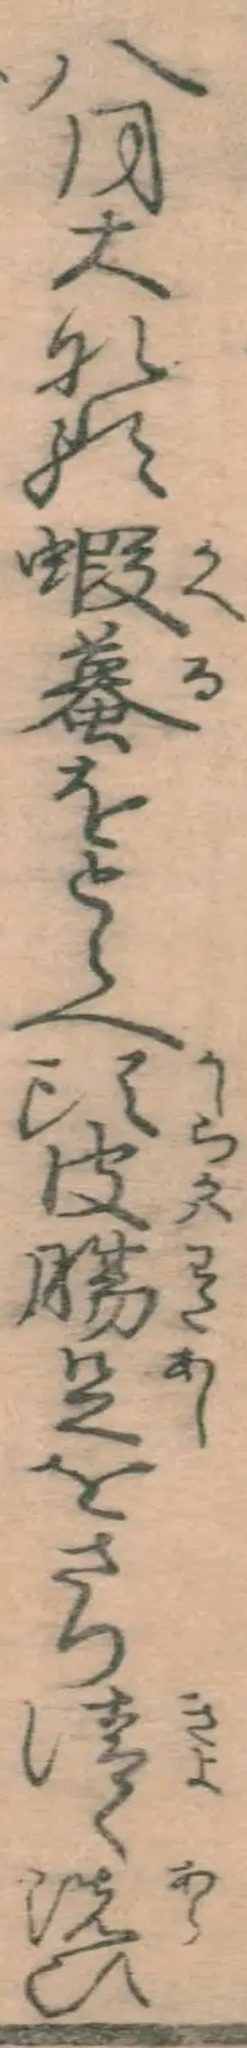八月大なる蝦蟇をとらへ頭皮膓足をさり清く洗ひ
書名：雨夜談
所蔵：国立国会図書館 National Diet Library, JAPAN
